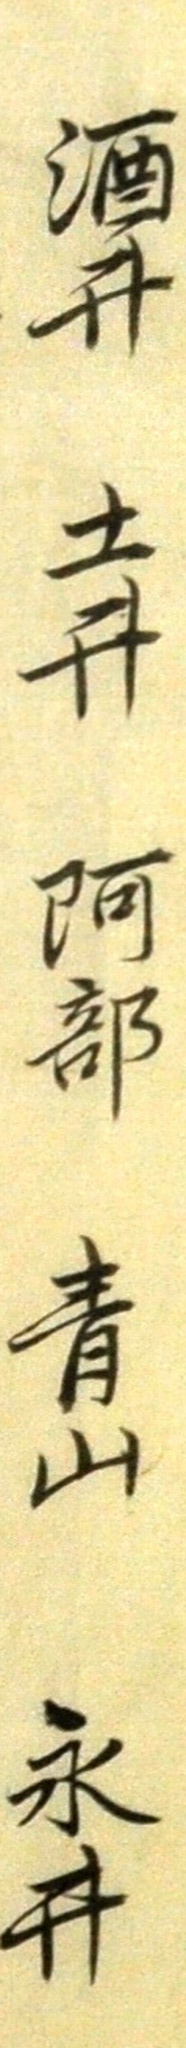酒井土井阿部青山永井
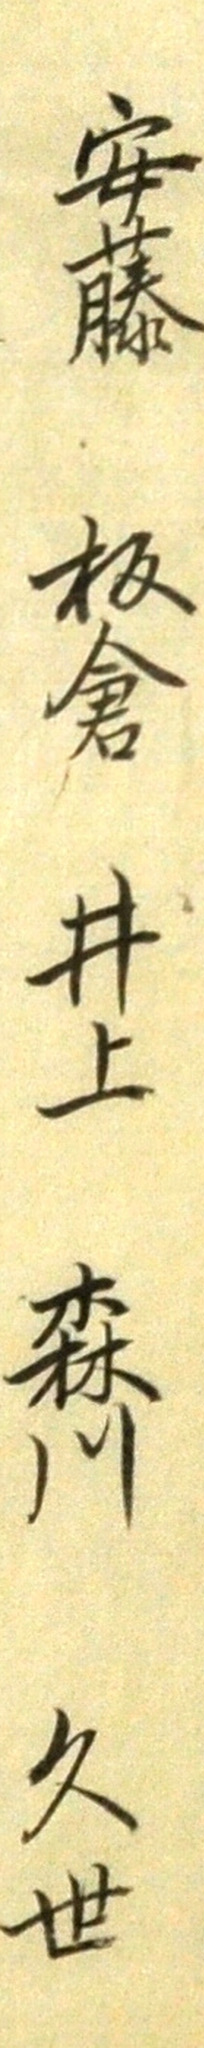安藤板倉井上森川久世
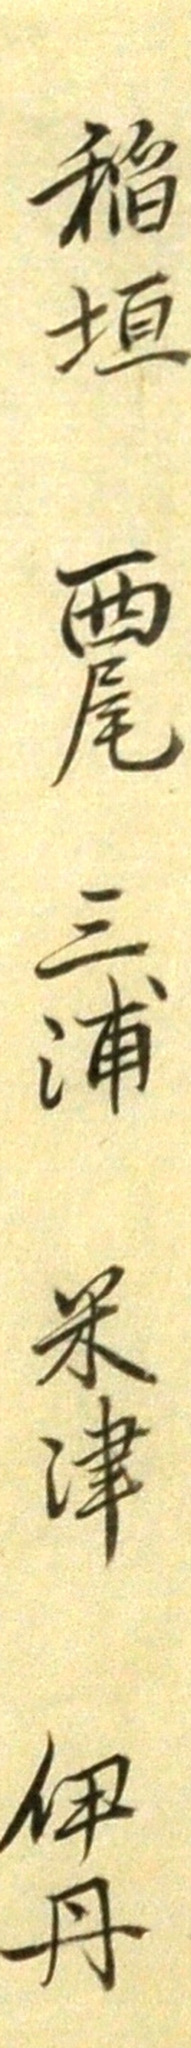稲垣西尾三浦米津伊丹
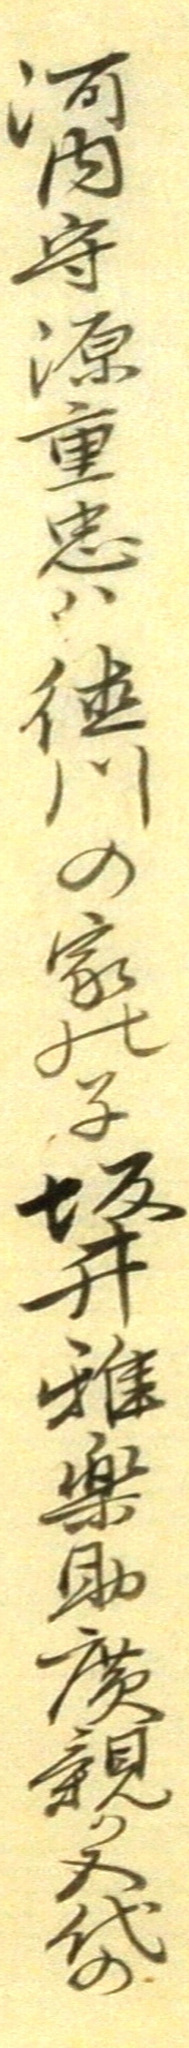河内守源重忠は徳川の家の子坂井雅楽助広親か五代の
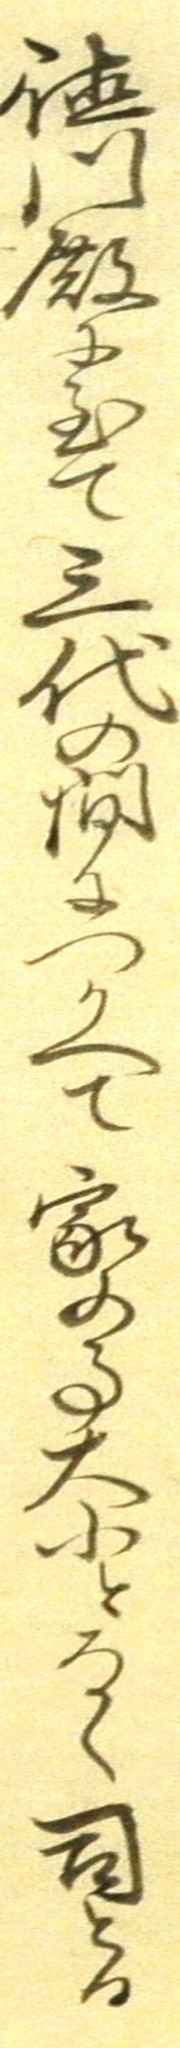徳川殿に至て三代の間につかへて家の事大小となく司とる
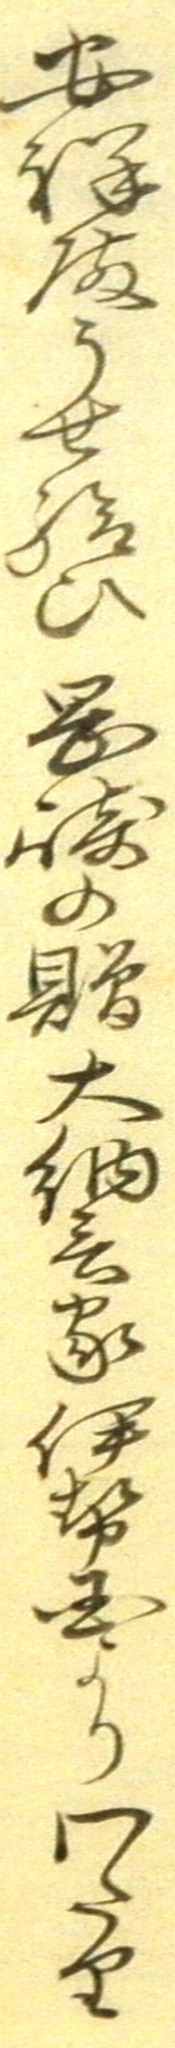安祥殿うせ給ひ岡崎の贈大納言家伊勢国よりわたり
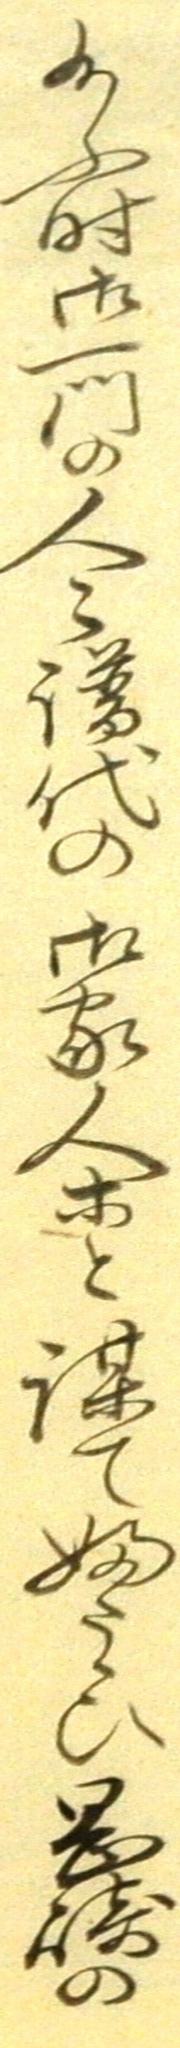給ふ時御一門の人々譜代の御家人等と謀てふたゝひ岡崎の
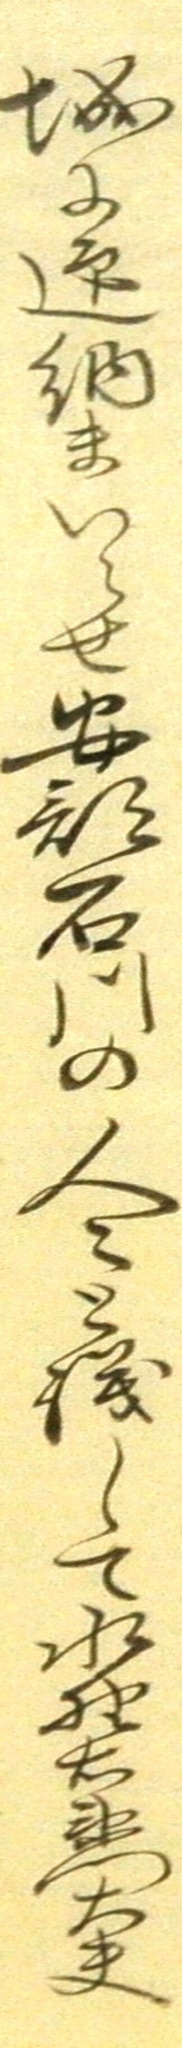城に迎納まいらせ安部石川の人々と議して水野右衛門大夫
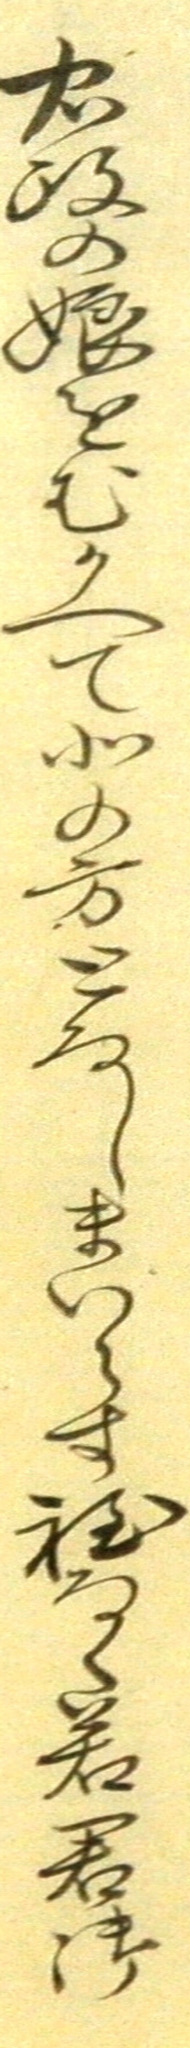忠政の娘をむかへて北の方となしまいらす程なく若君御
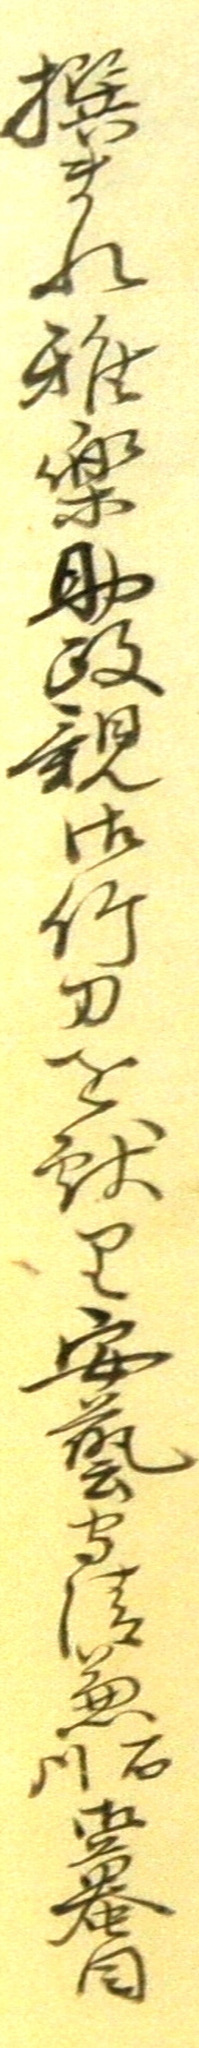撰まれ雅楽助政親御竹刀を献り安芸守清兼石川御蟇目

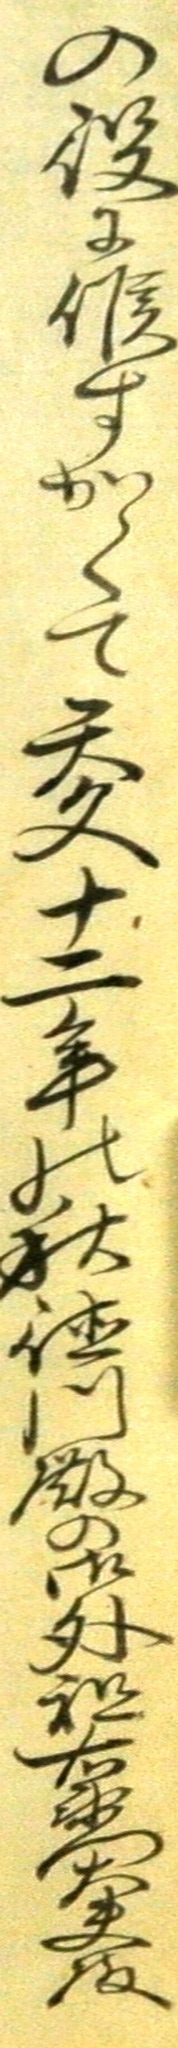の役に候すかくて天文十二年の秋徳川殿の御外祖右衛門大夫殿
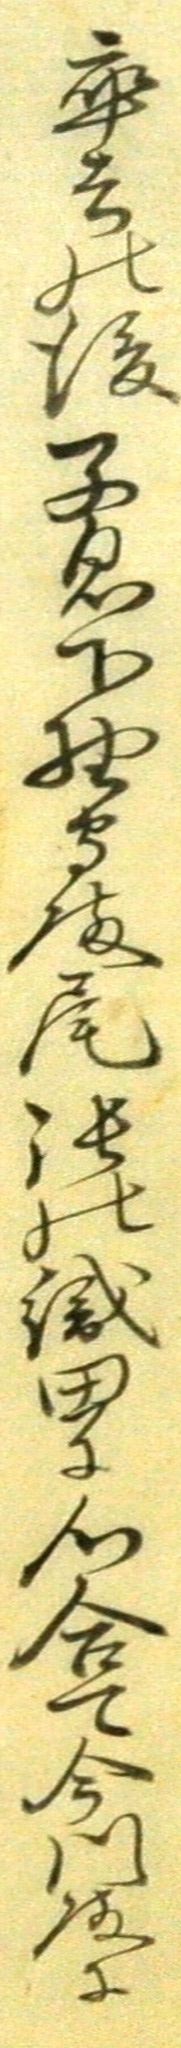卒去の後子息下野守殿尾張の織田に心合て今川殿に
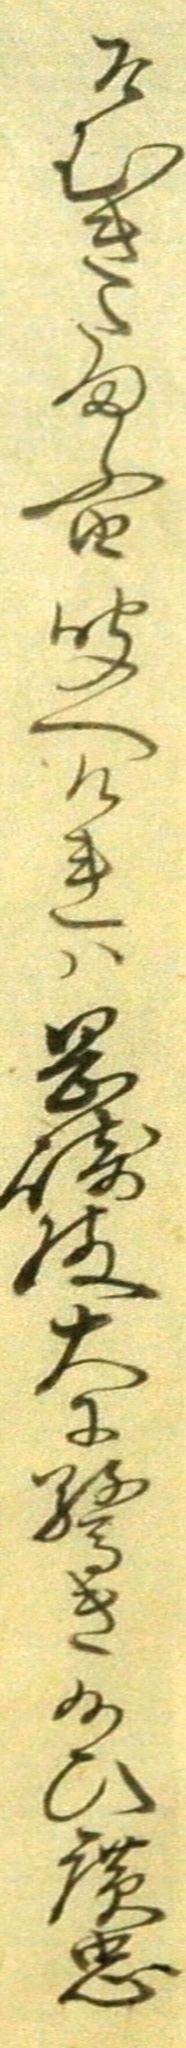そむきたまふ由聞へけれは岡崎殿大に驚き給ひ広忠
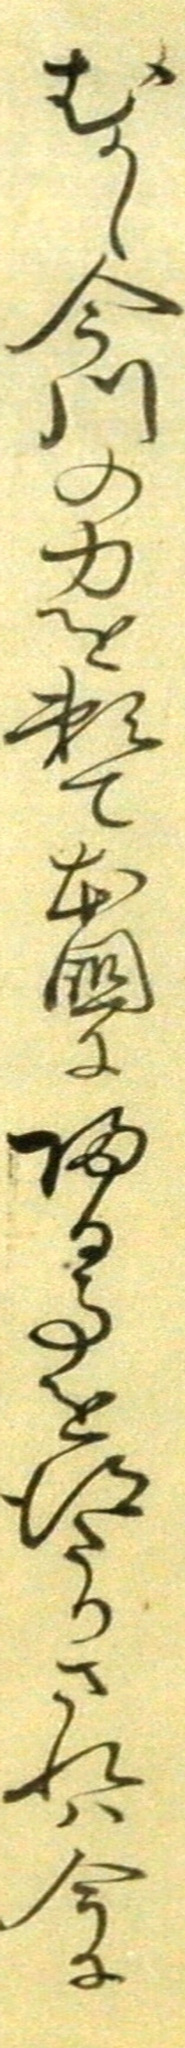むかし今川の力を頼て本国に帰る事を得たりされは今に
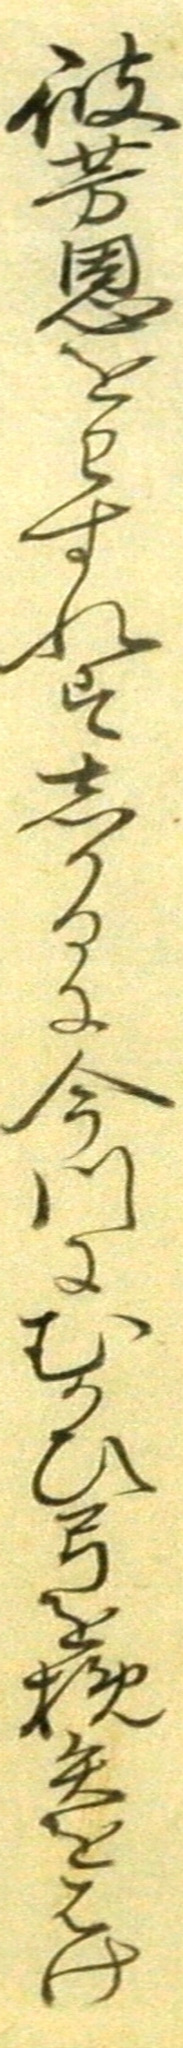彼芳恩をわすれすしかるに今川にむかひ弓を挽矢をはけ
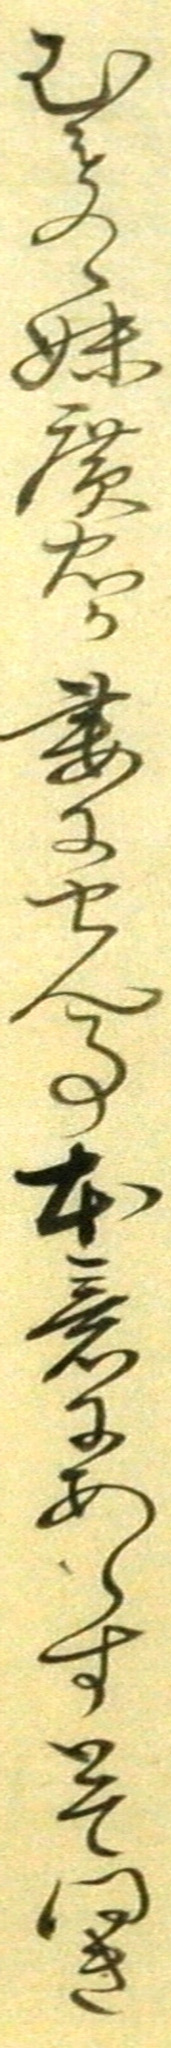むものゝ妹広忠か妻にせん事本意にあらすとて同き
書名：藩翰譜（五）
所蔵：伊那市立高遠町図書館・合同会社AMANE
